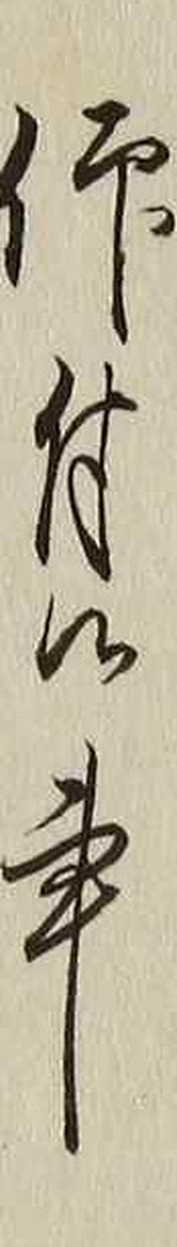仰出候事
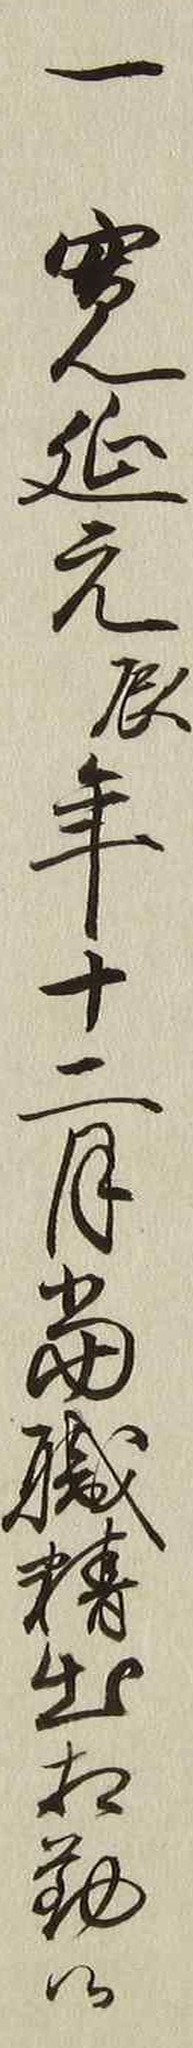一寛延元辰年十二月当職精出相勤候
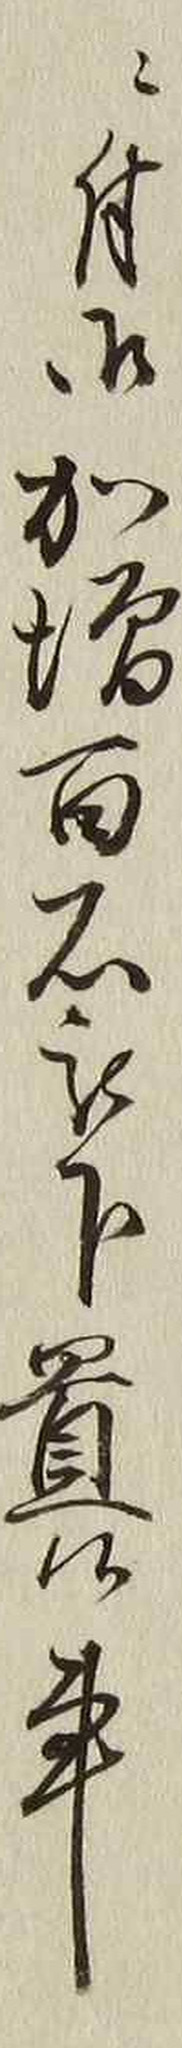ニ付御加増百石被下置候事
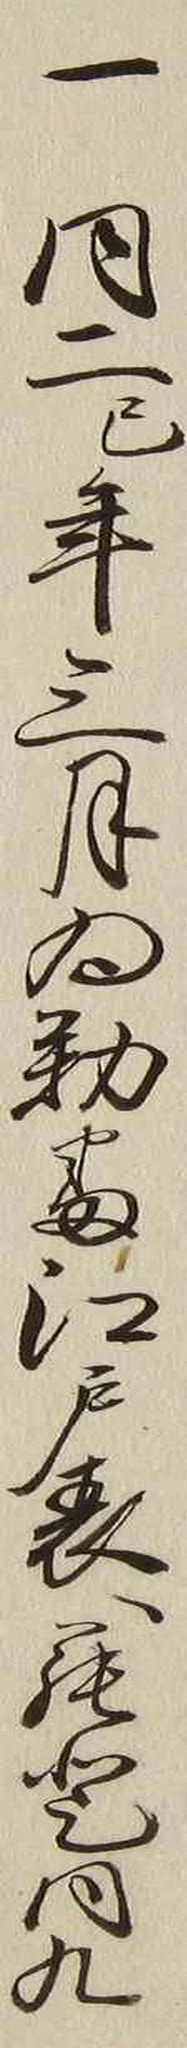一同二巳年三月為勤番江戸表へ罷登同九
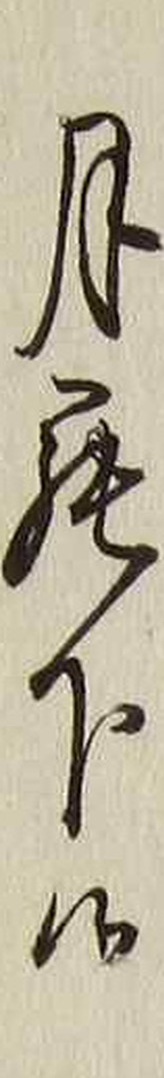月罷下候
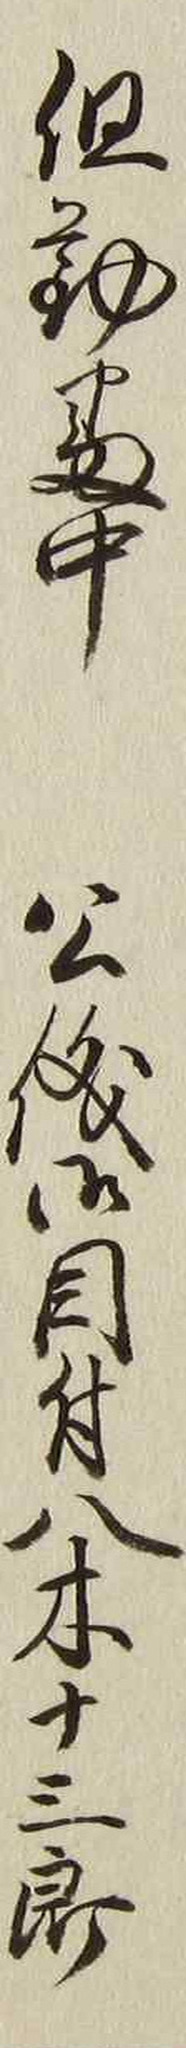但勤番中公儀御目付八木十三郎
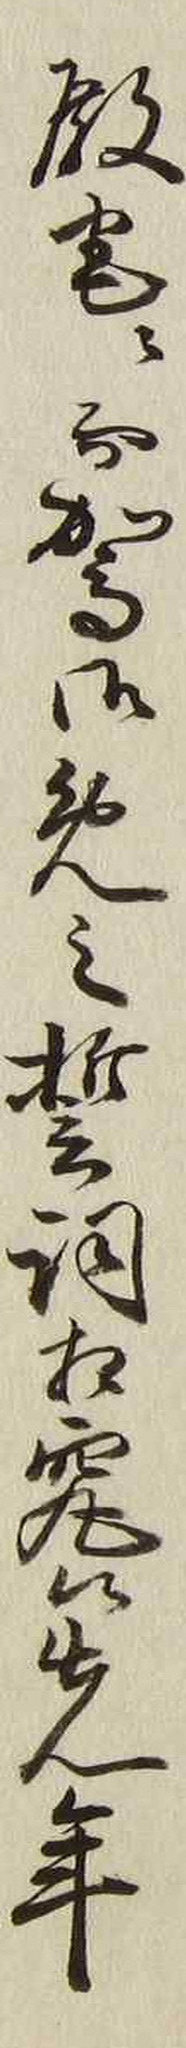殿宅ニ而駕御免之誓詞相究候先年
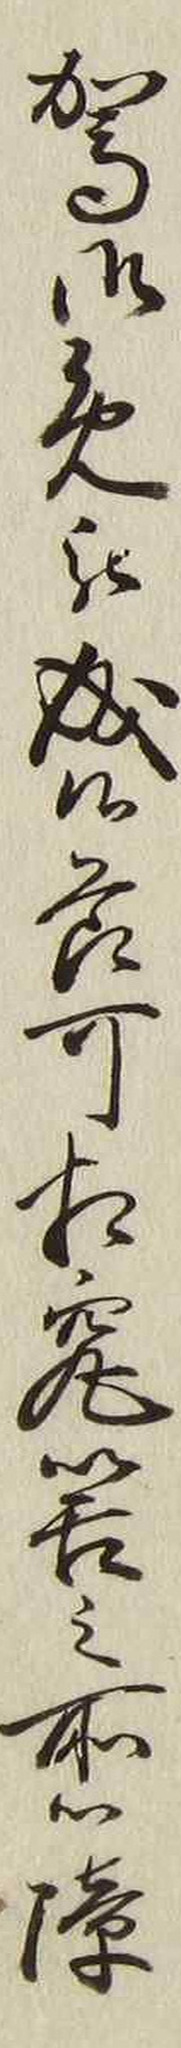駕御免被成候節可相究筈之所御障
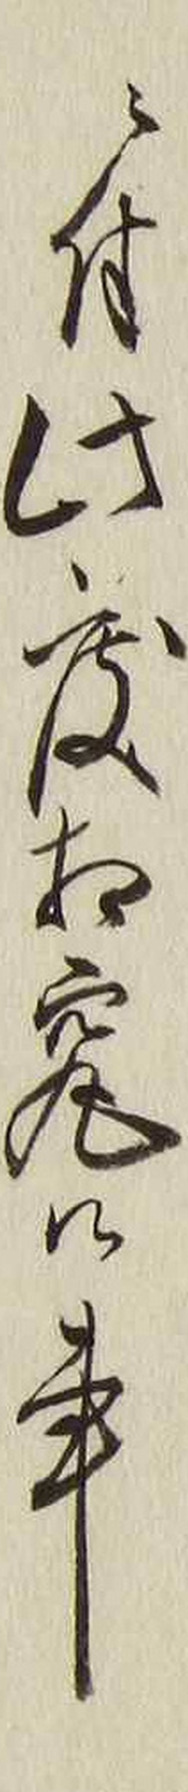ニ付此度相究候事
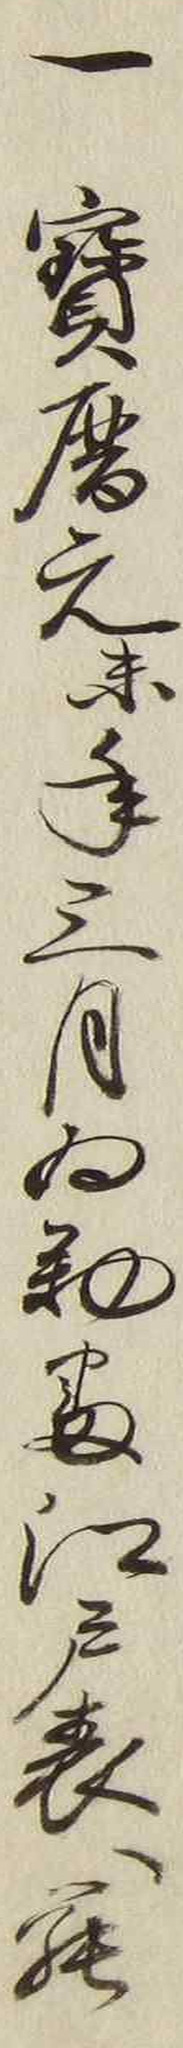一宝暦元未年三月為勤番江戸表へ罷

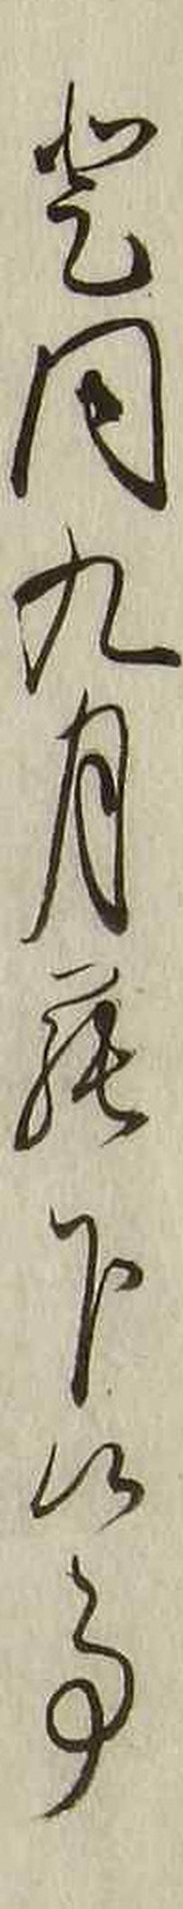登同九月罷下候事
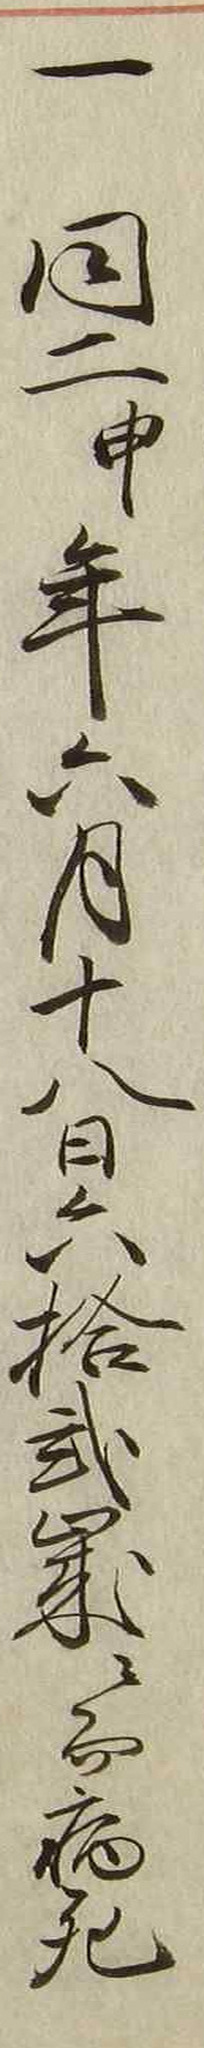一同二申年六月十八日六拾弐歳ニ而病死
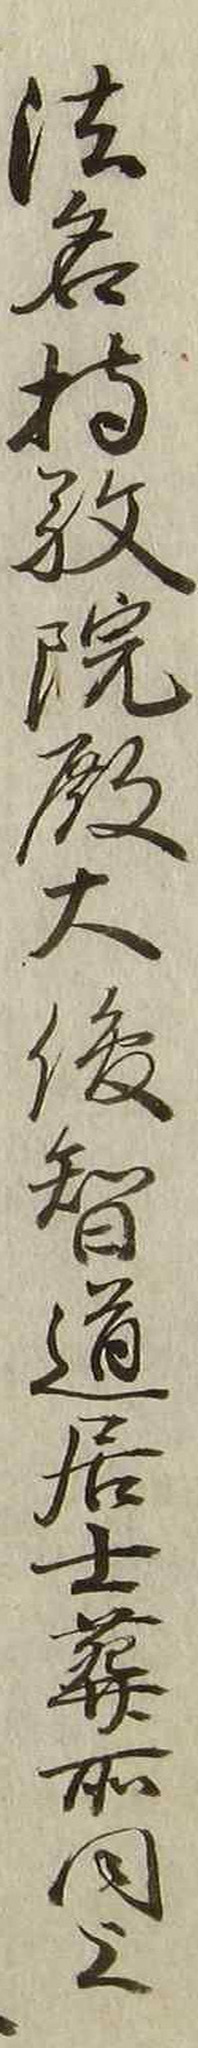法名持敬院殿大俊智道居士葬所同上
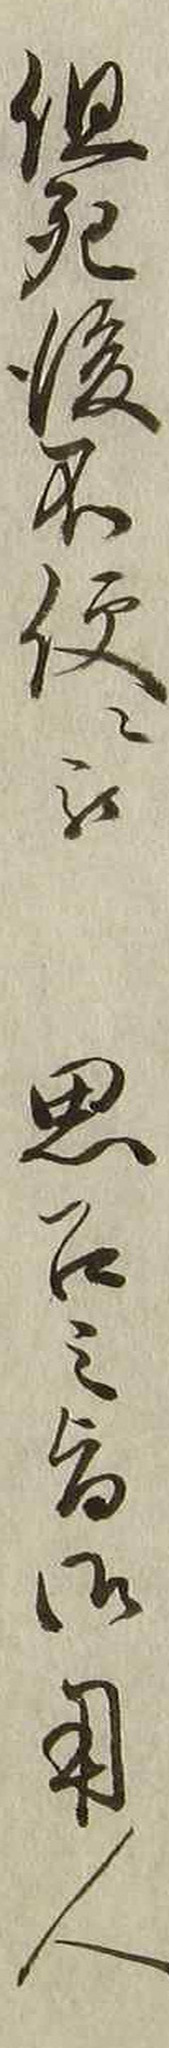但死後不便ニ被思召之旨御用人
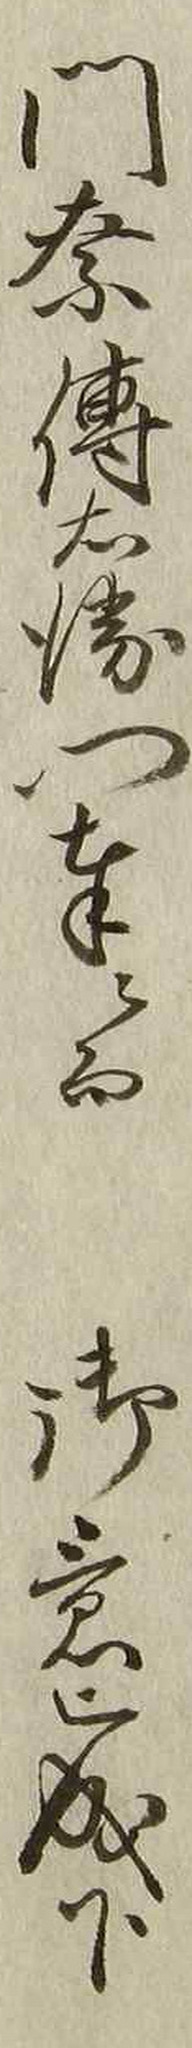門奈伝右衛門奉ニ而御意被成下
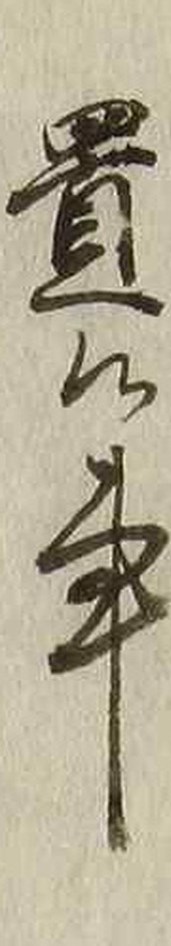置候事
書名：諸士系譜　巻之21　い之部21
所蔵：会津若松市立会津図書館
